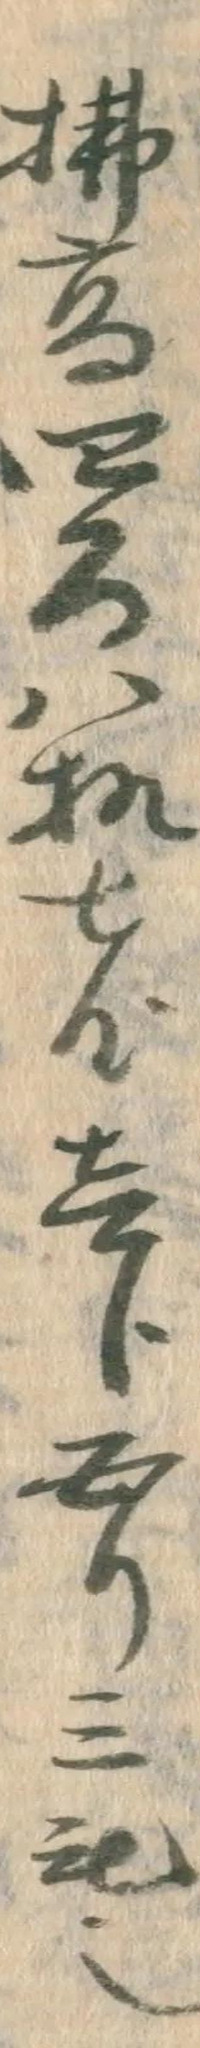払高四百八拾七匁壱分五厘三毛也、
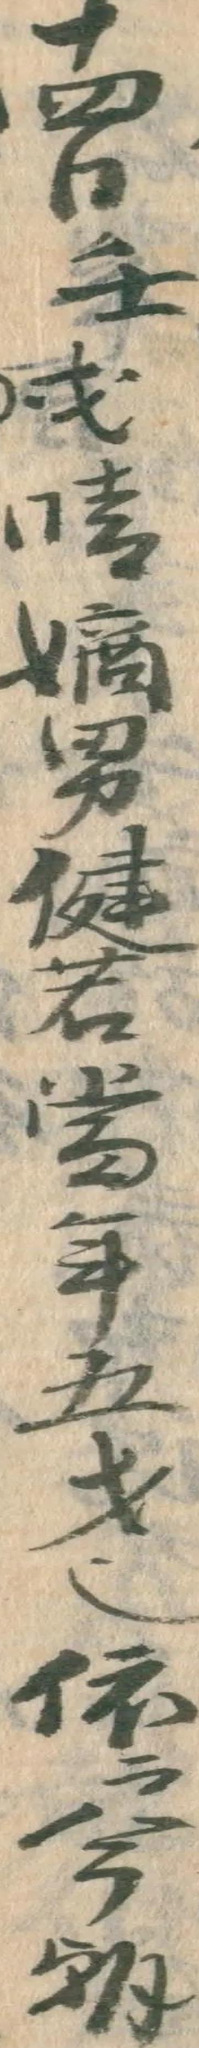十四日壬戌晴、嫡男健若當年五才也、依而今朝
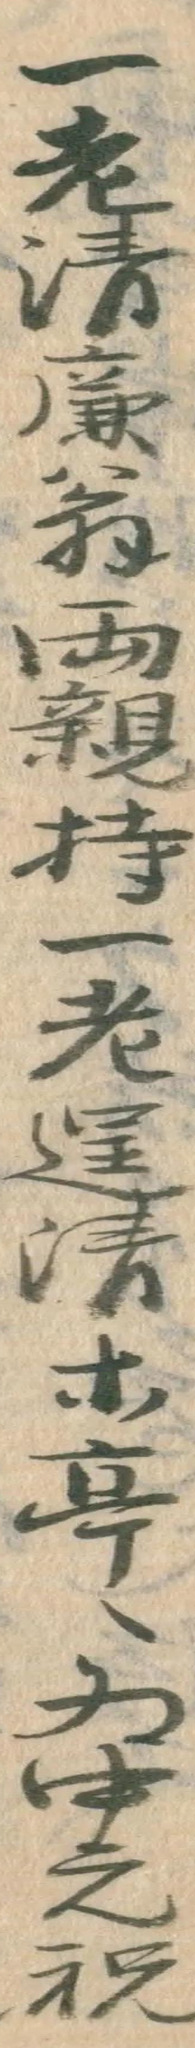一老清廉翁・両親持一老逞清等亭へ為中元祝

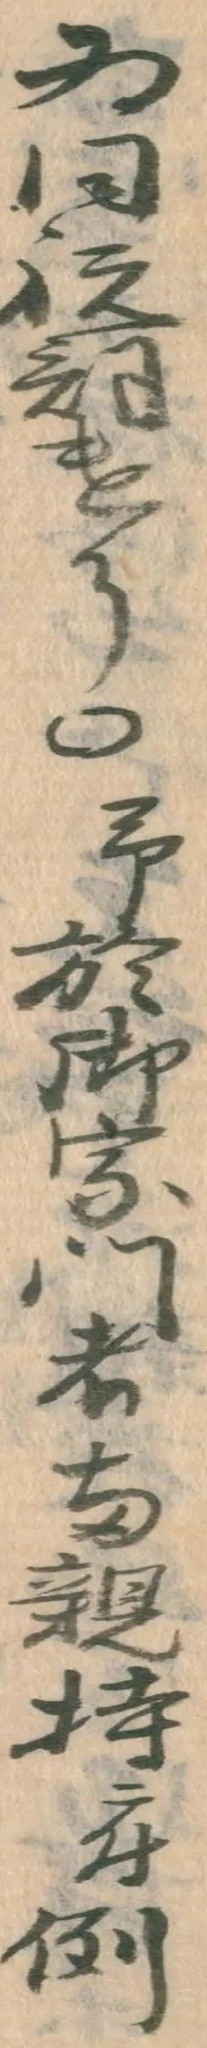為同祝詞遣了、○予於御家門者、両親持ニ付、例
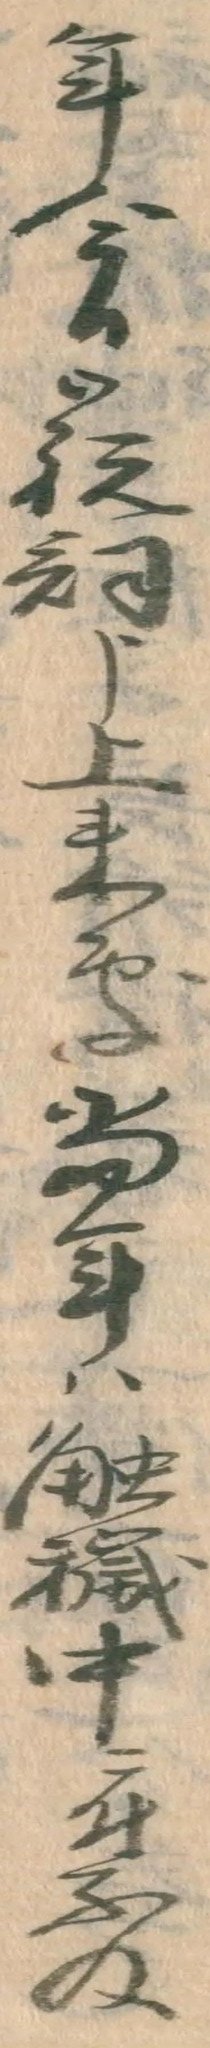年今日御祝詞申上来處、當年ハ触穢中ニ付不及、
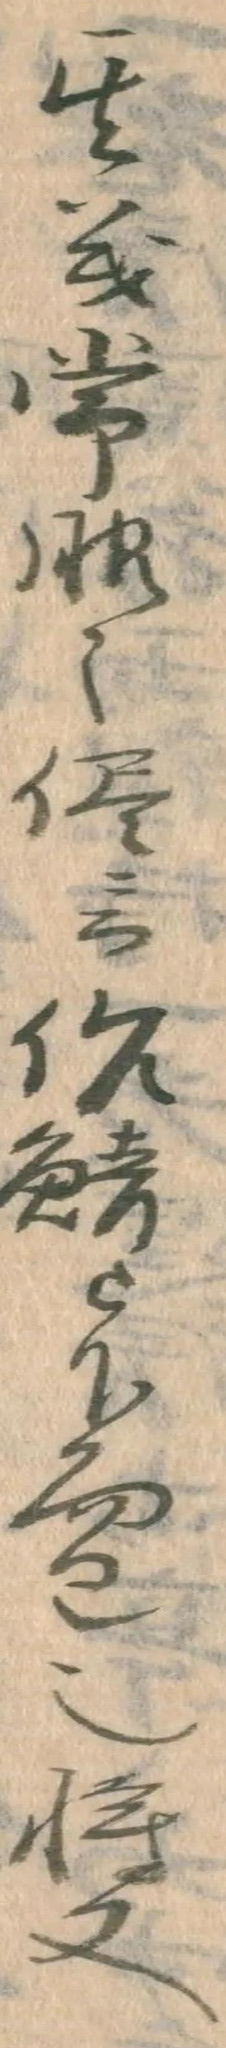其義常状之侭ニ而、作鯖被下候而已也、将又
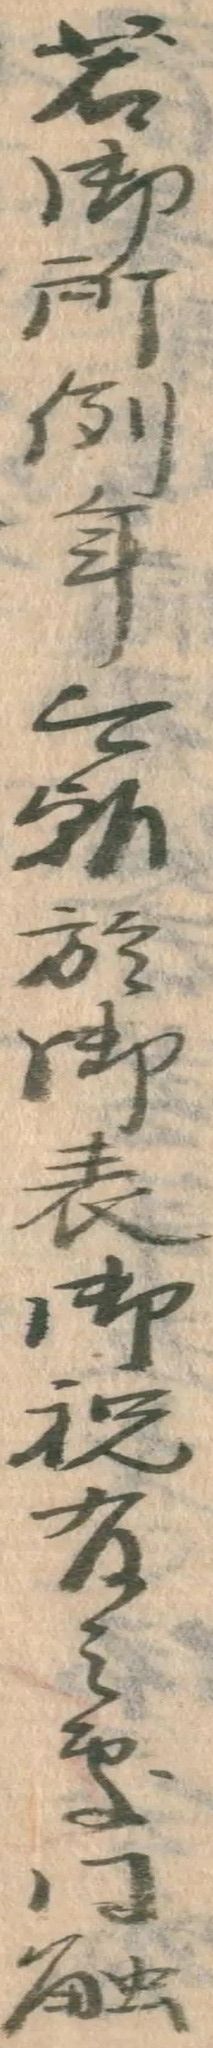若御所例年今朝於御表御祝有之處、同触
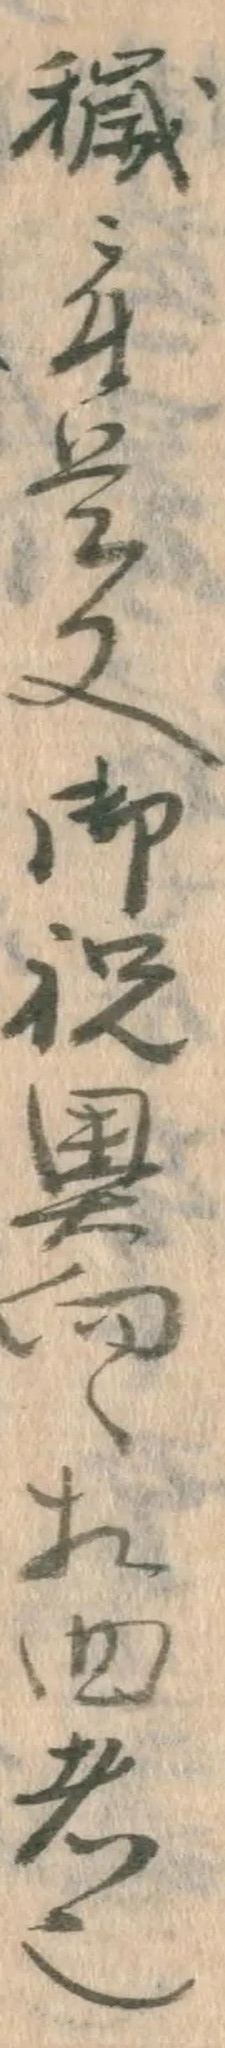穢ニ付、是又御祝奥向へ相回者也、
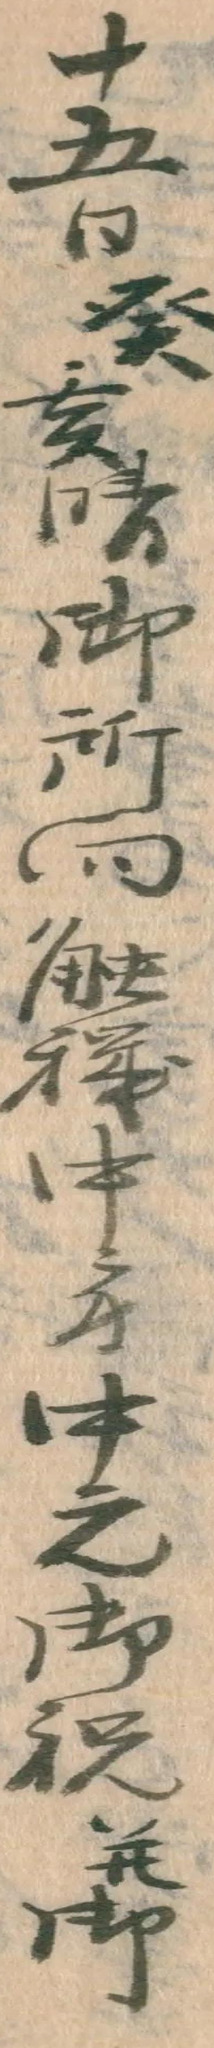十五日癸亥晴、御所向触穢中ニ付、中元御祝并御
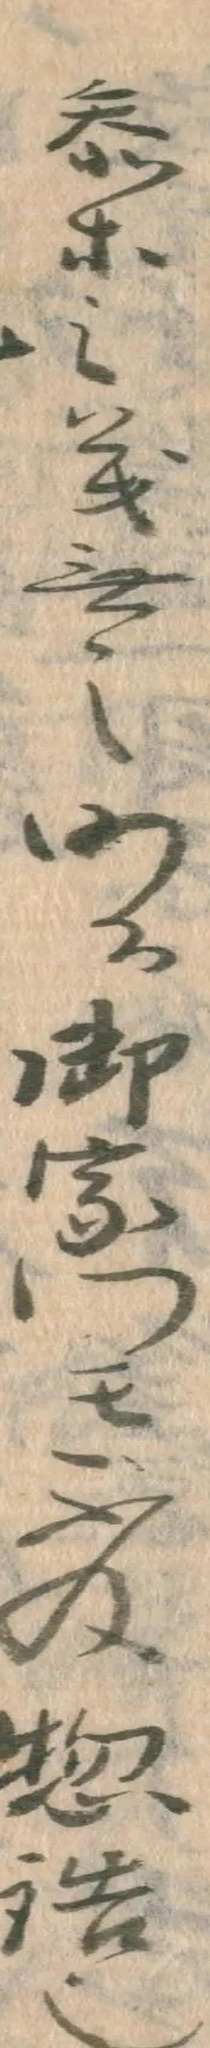参等之義無之、仍而御家門モ不及惣詰也、
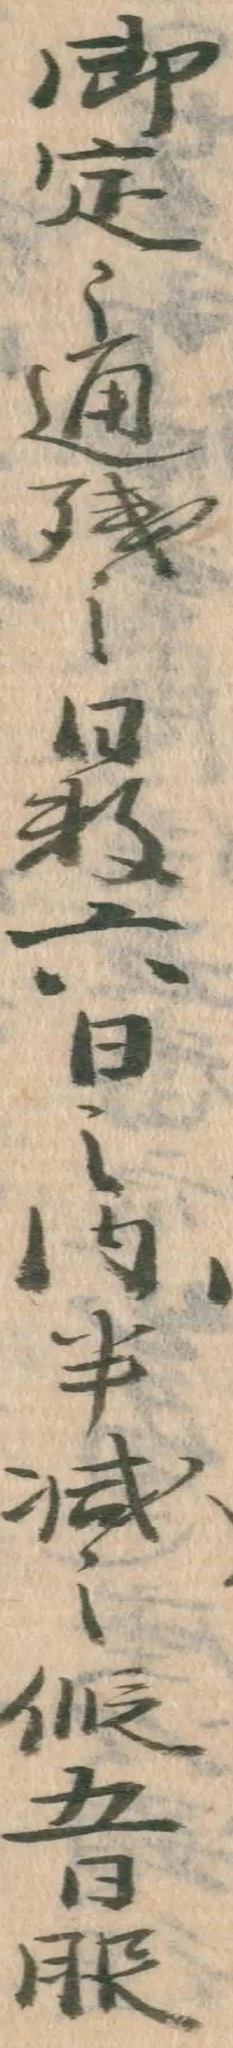御定之通残之日数六日之内半減之假五日・服
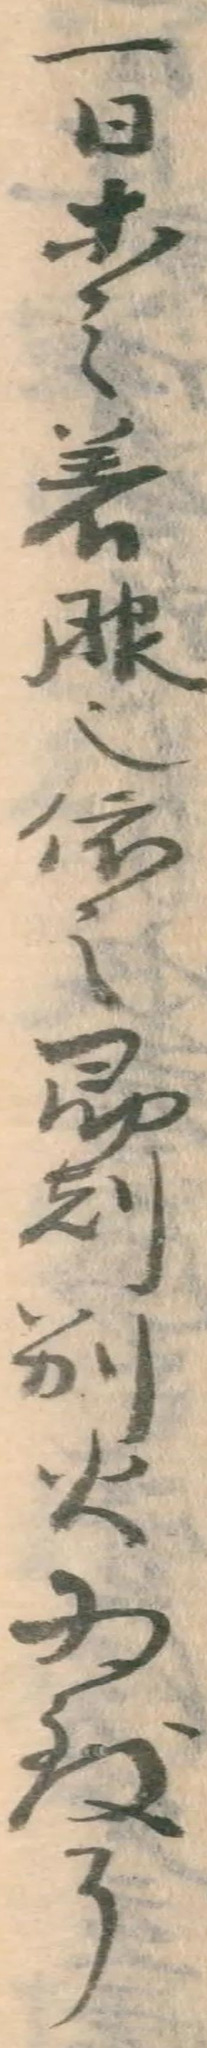一日等之着服也、依之即刻別火為致了、
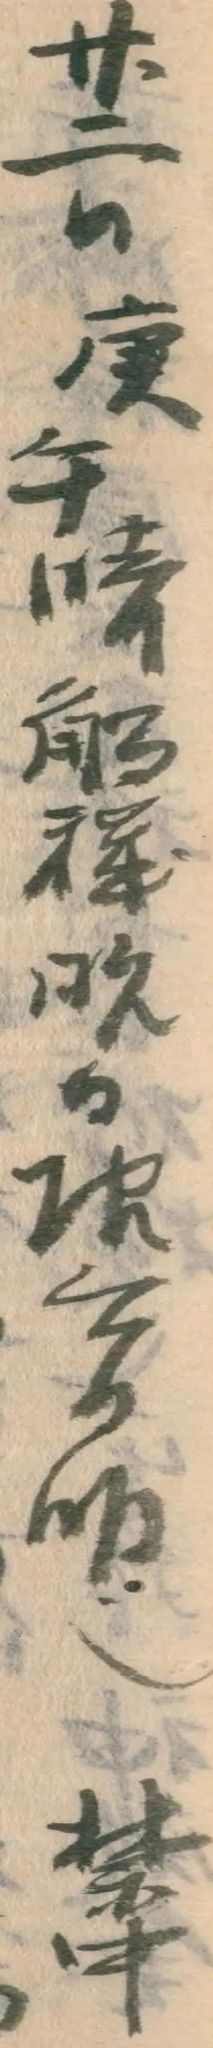廿二日庚午晴、触穢晩日限、今日明也、禁中
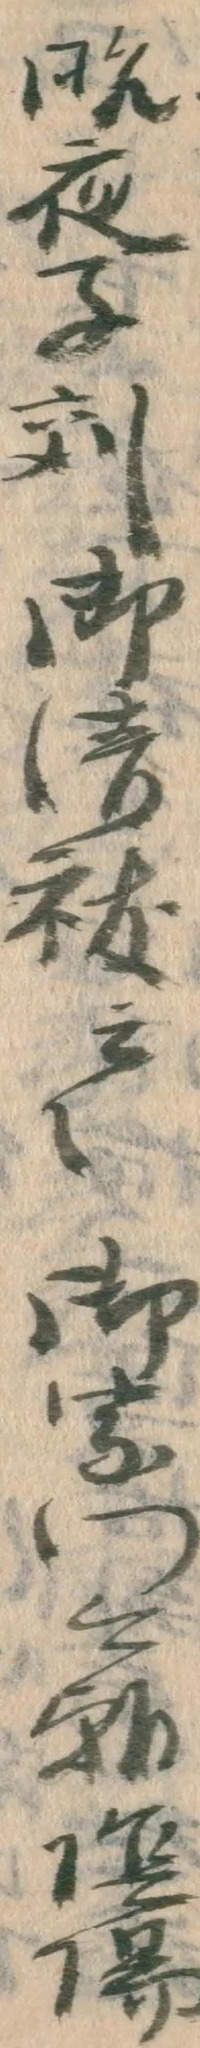昨夜子刻御清祓云々、御家門今朝陰陽
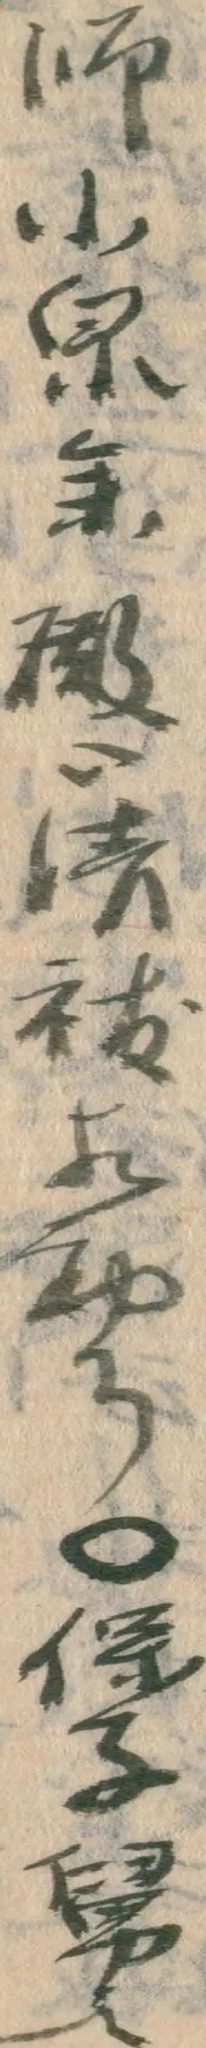師小泉参、殿御清祓相勤了、○保子舅之
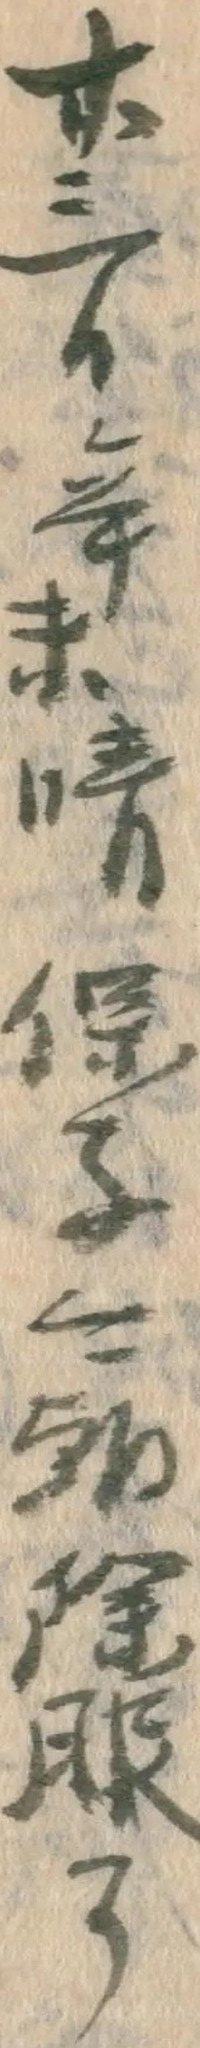廿三日辛未晴、保子今朝除服了、
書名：賀茂社記録. 第63冊
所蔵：国立国会図書館 National Diet Library, JAPAN
